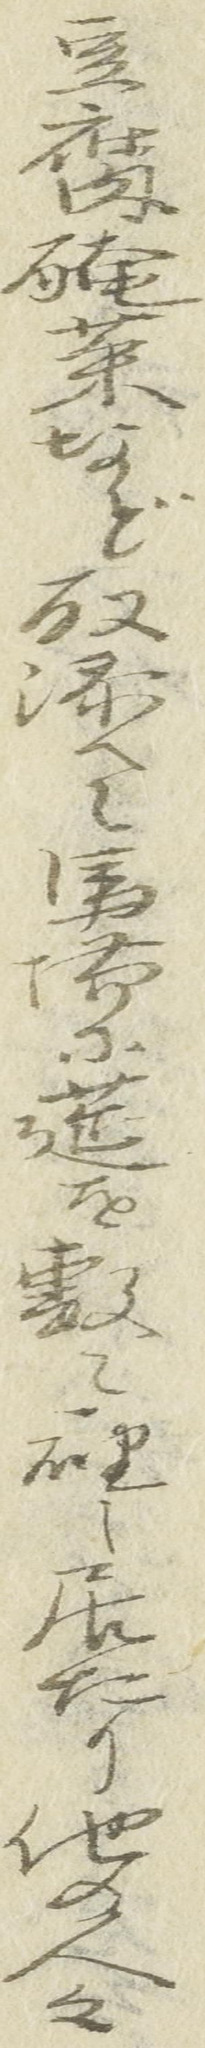豆腐醃菜など取添へて馬場に莚を敷て座し居たり他の人々
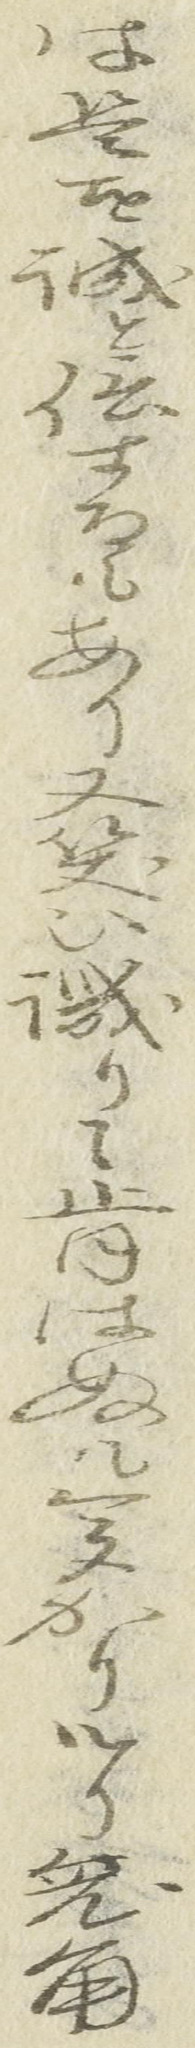は是を誠と信するもあり又笑い譏りて肯はぬも多かりけり兎角
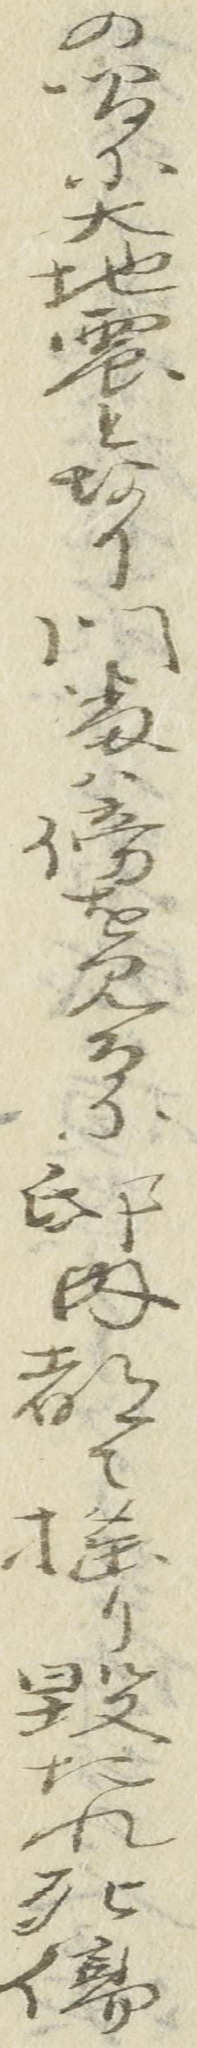の間に大地震となり門番は傍を見るに邸内都て揺り毀たれ死傷
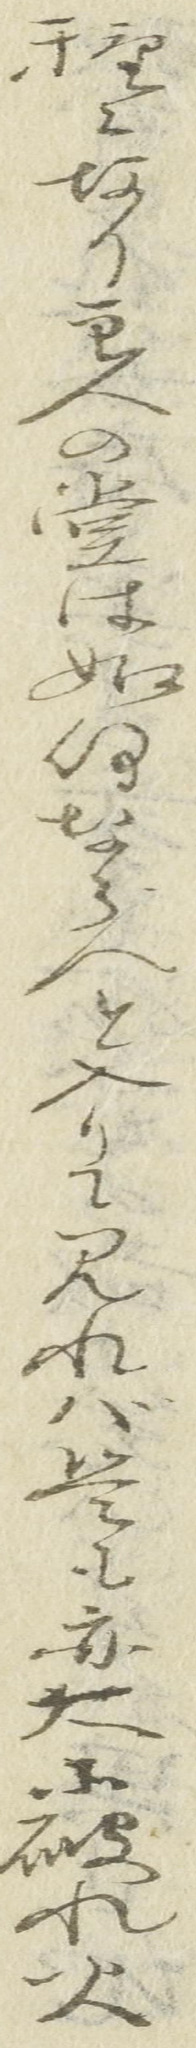種々なり主人の堂は如何ならんと入りて見れば是も亦大に破れ火
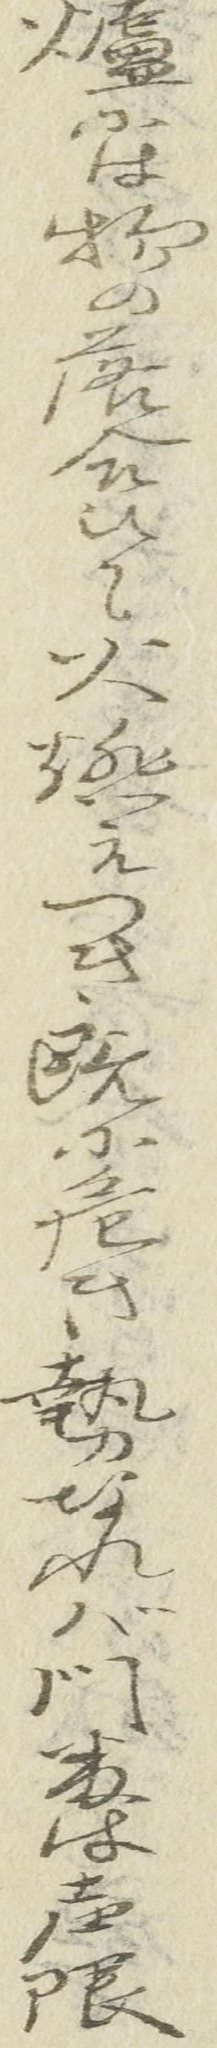爐には物の落合ひて火燃えつき既に危き勢なれば門番は声限
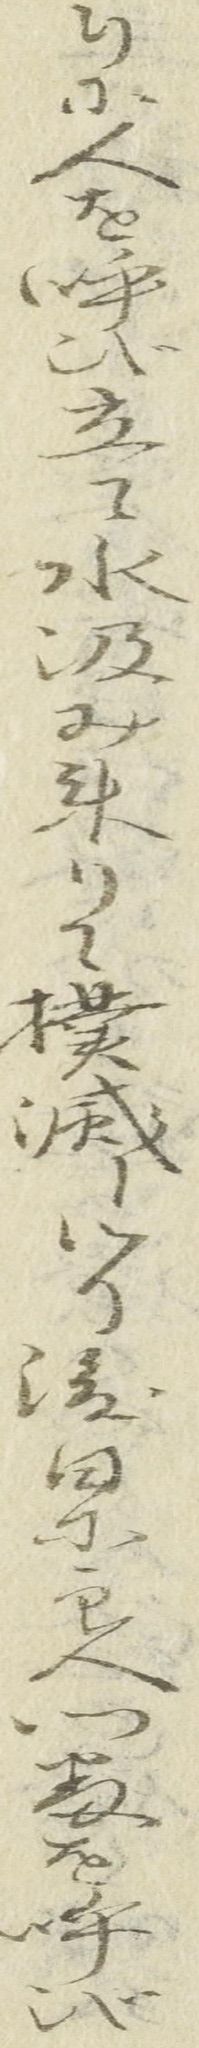りに人を呼び立て水汲み来りて撲滅しけり後日に主人門番を呼び
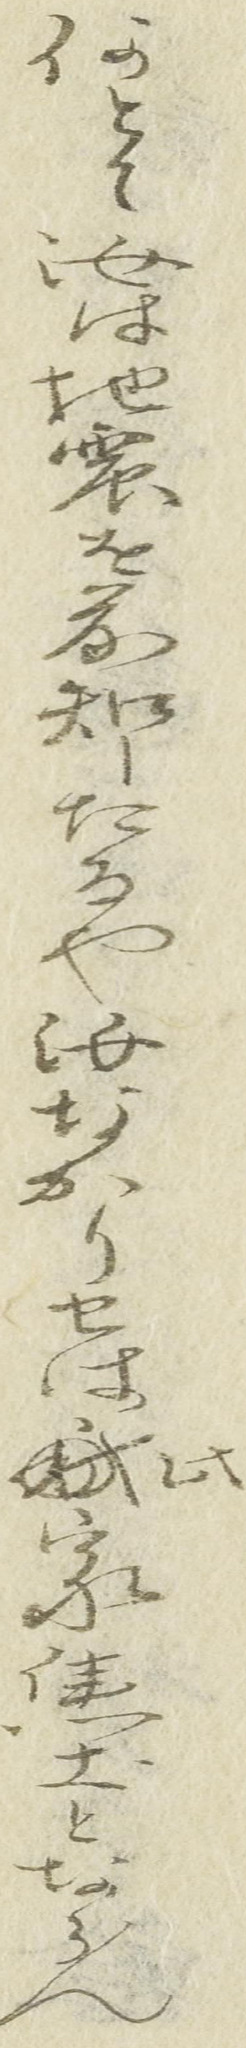何とて汝は地震を前知したるや汝なかりせは我家焦土とならん
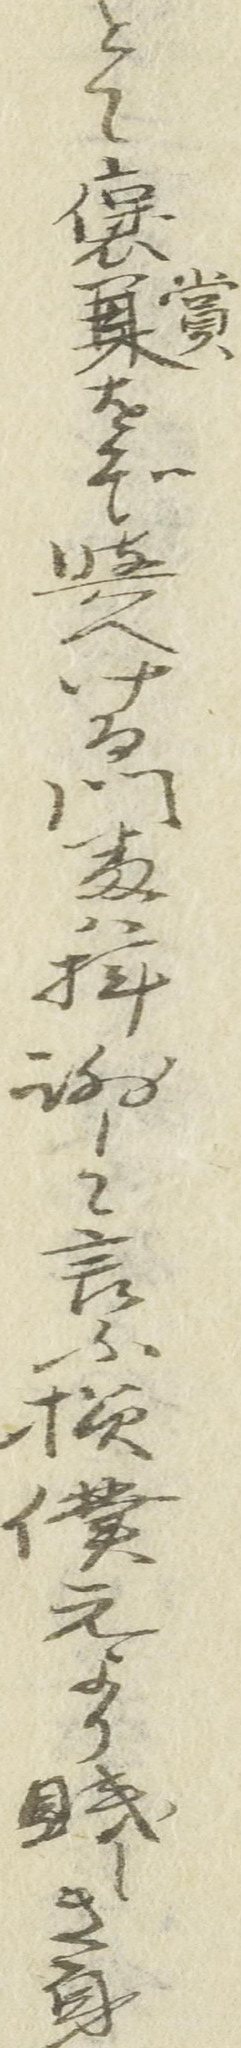とて褒美をぞ与へける門番は拝謝して言ふ様僕元より賤しき身
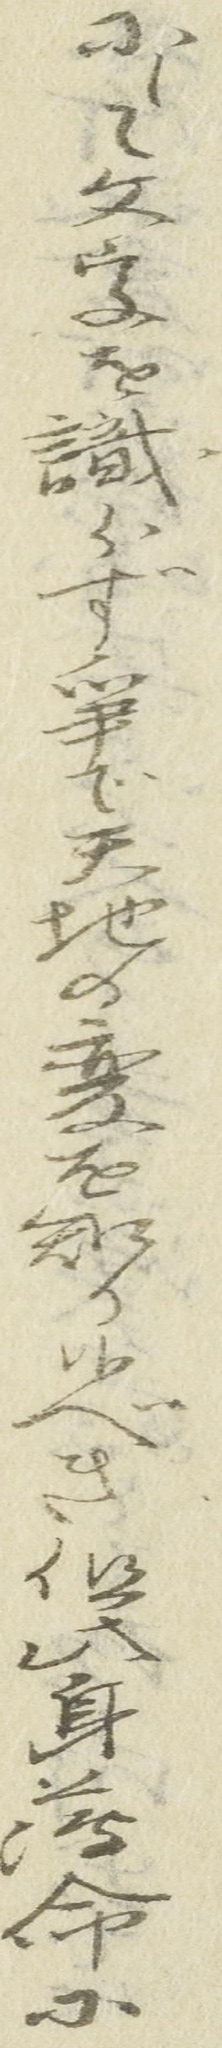にして文字を識らず争で天地の変を知り候べき但此身薄命に
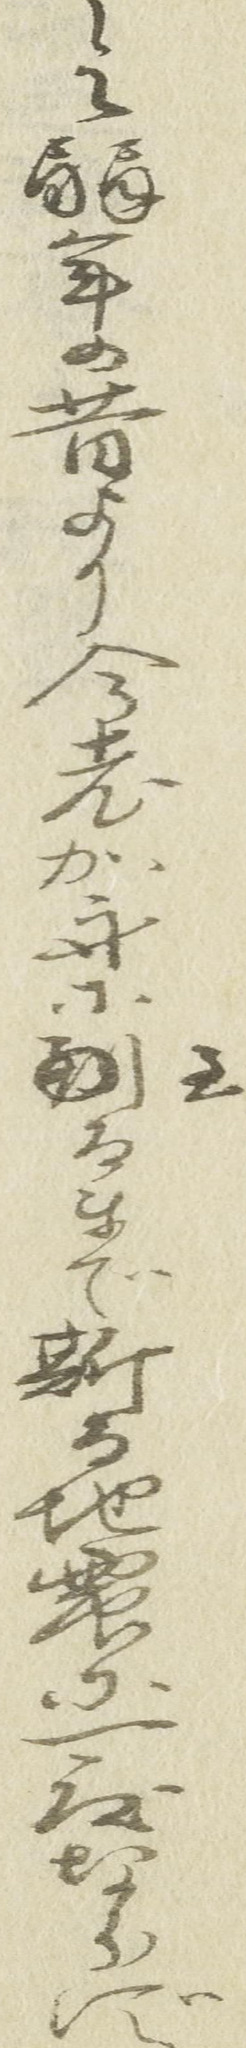して弱年の昔より今老が身に到るまで斯る地震に一度ならず
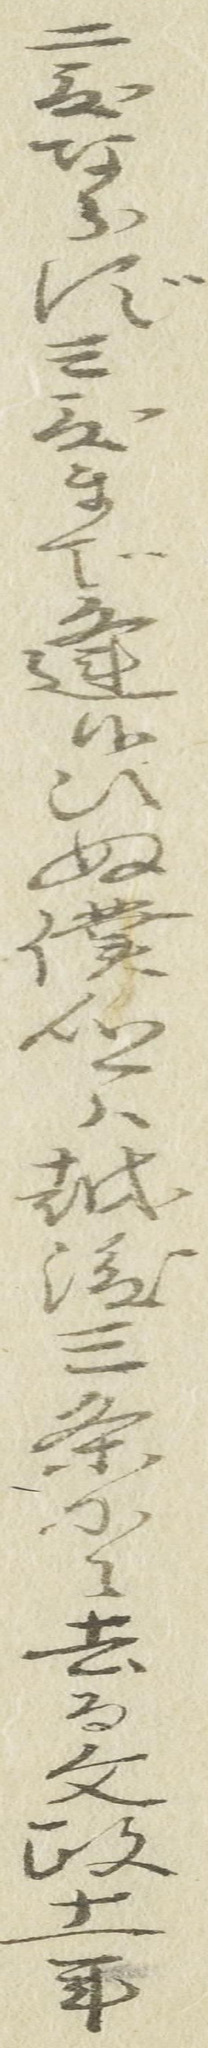二度ならず三度まで逢候ひぬ僕郷は越後三条にて去る文政十一年
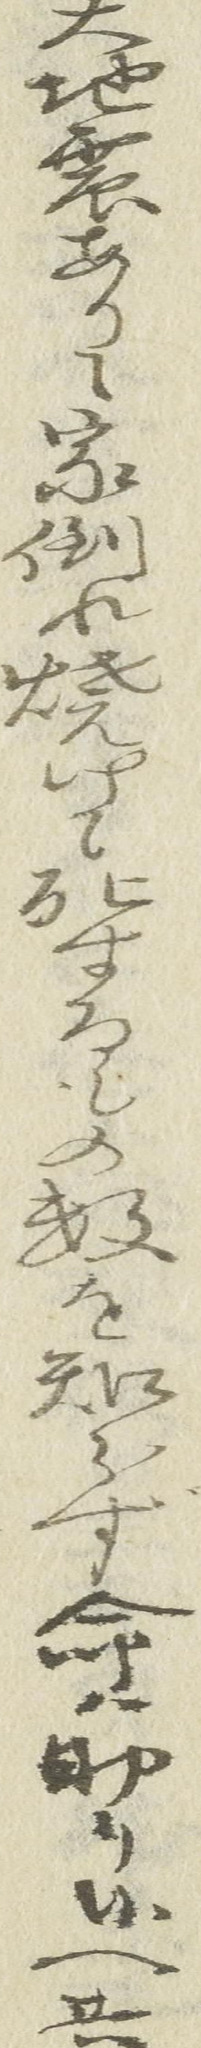大地震ありて家倒れ焼けて死するもの数を知らず命は助り候へ共
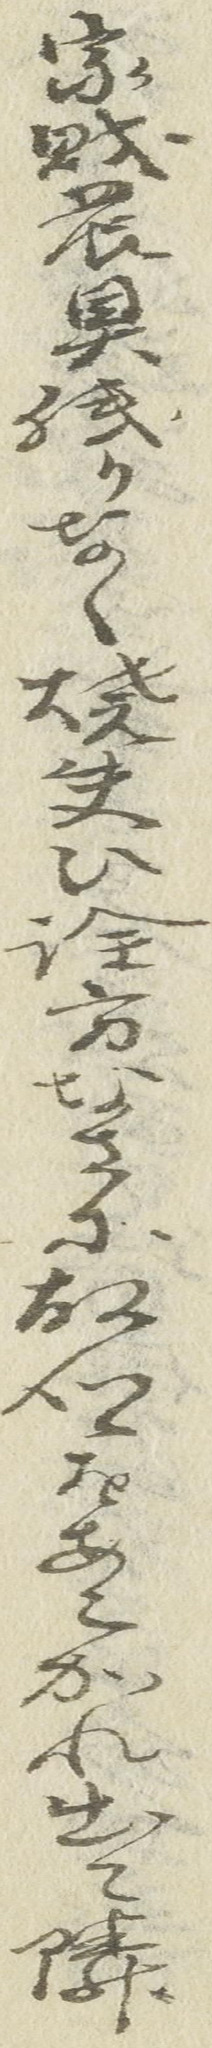家財農具残りなく焼失ひ詮方なさに故郷をあこがれ出て隣
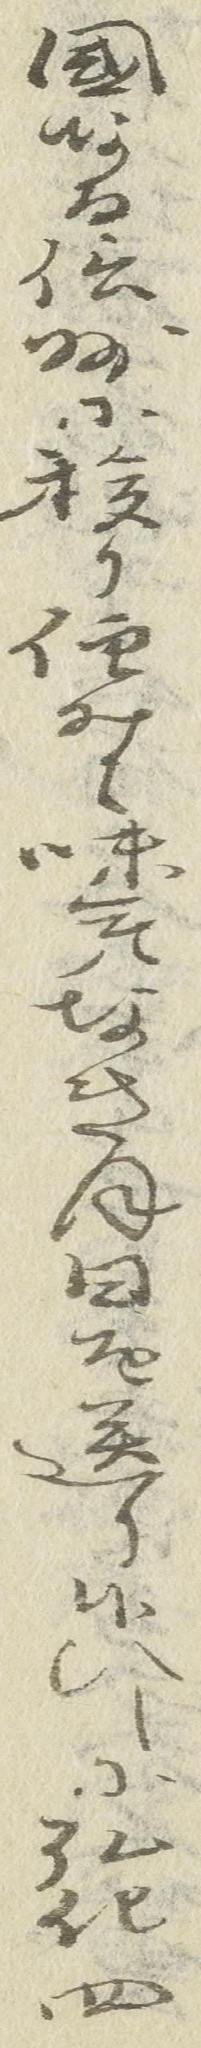国なる信州に移り住みて味気なき月日を送り候ひしに弘化四
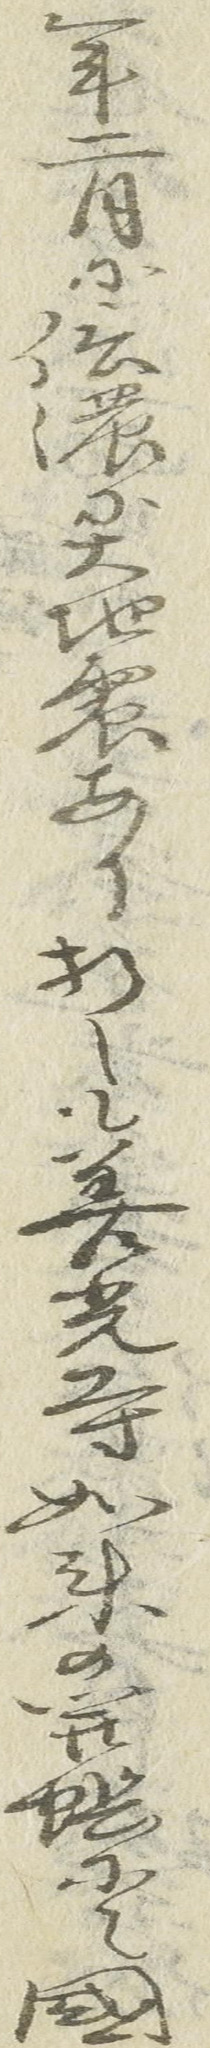年二月に信濃に大地震あり折しも善行寺如来の開帳にて国
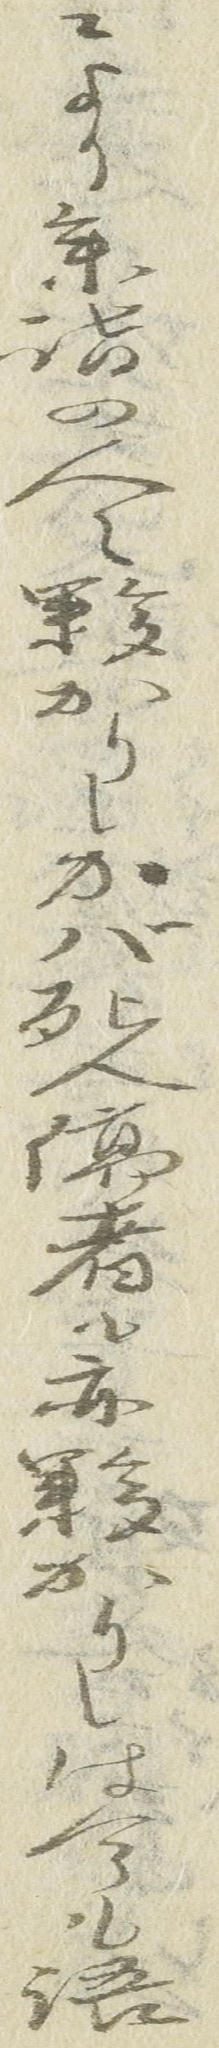々より参詣の人々夥かりしかば死人傷者も亦夥かりしは今も語
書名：地震前兆集　全
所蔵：東京大学地震研究所図書室 Earthquake Research Institute Library, The University of Tokyo, JAPAN
